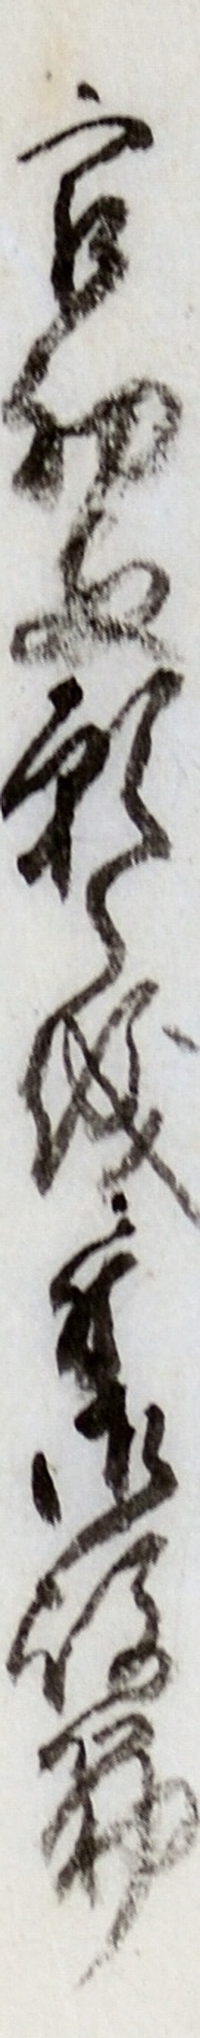最初両願之儀に付御役筋
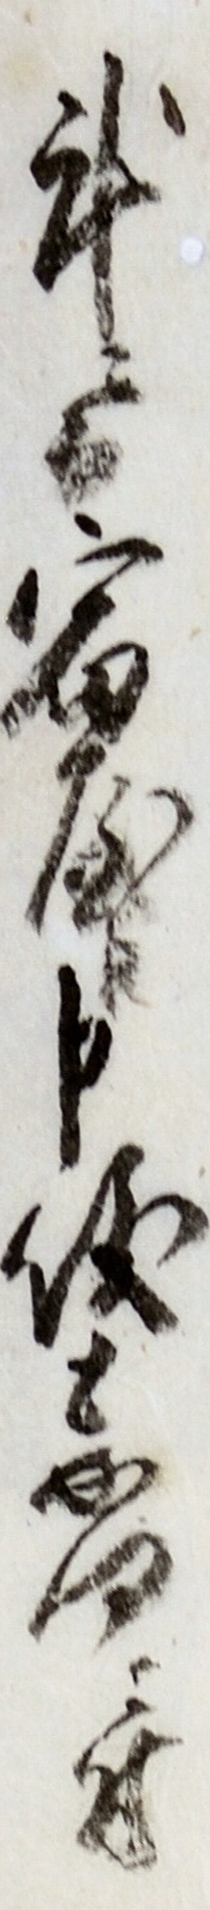計にて宿屋え申儀も如何に付
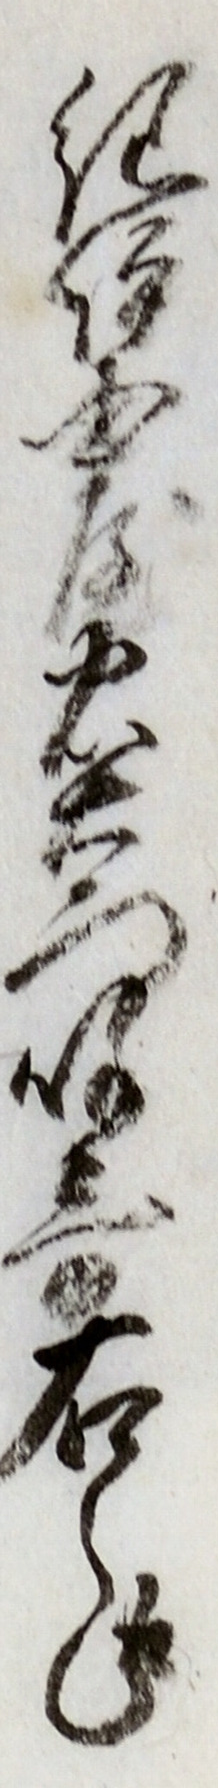紀伊国屋忠右衛門呼寄右之趣
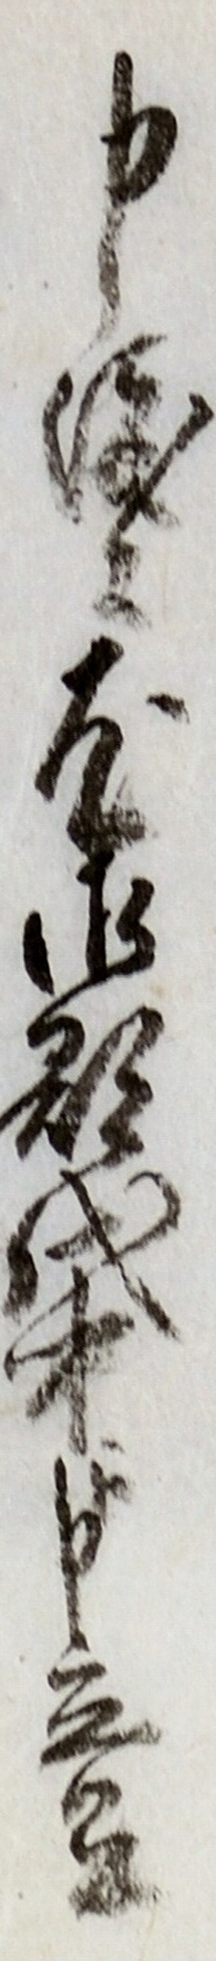申渡候尤御郡代中え申立義
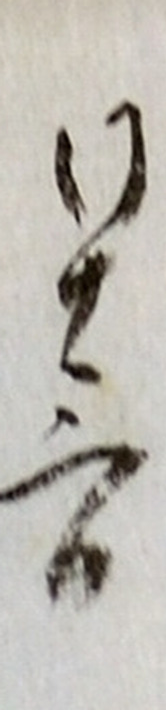同十三日
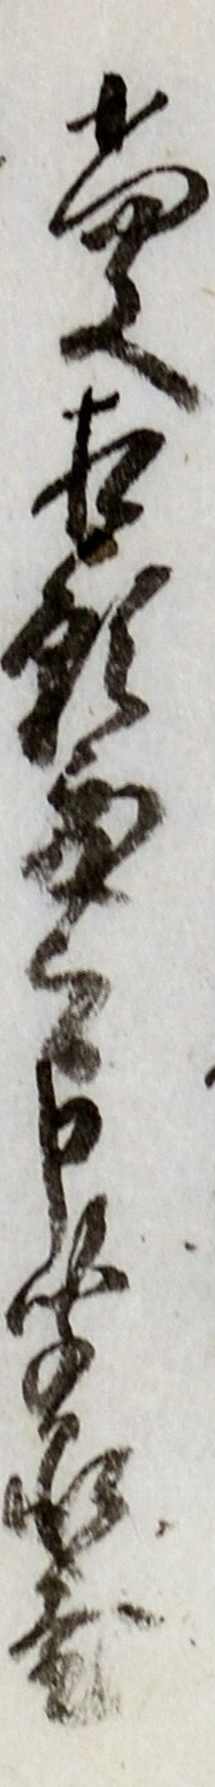尚又相願度旨申聞承置
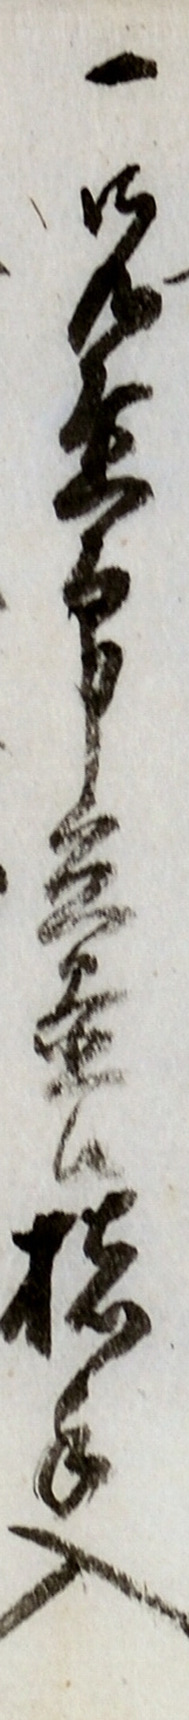一先達而申立置候楮手入
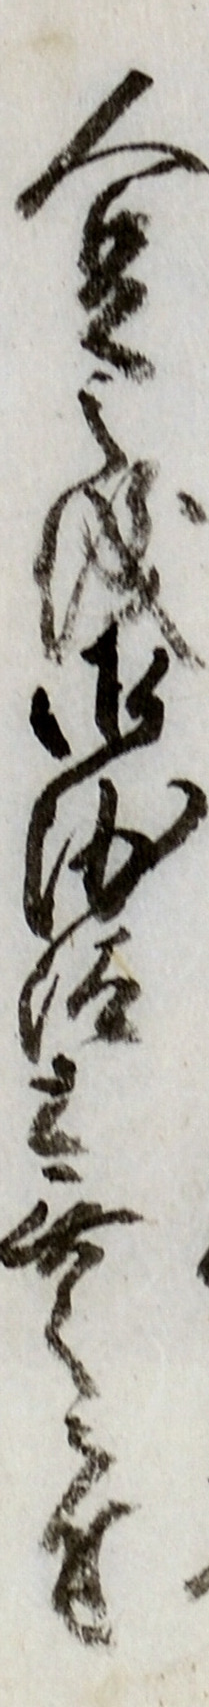人足之儀御沙汰も無之に付
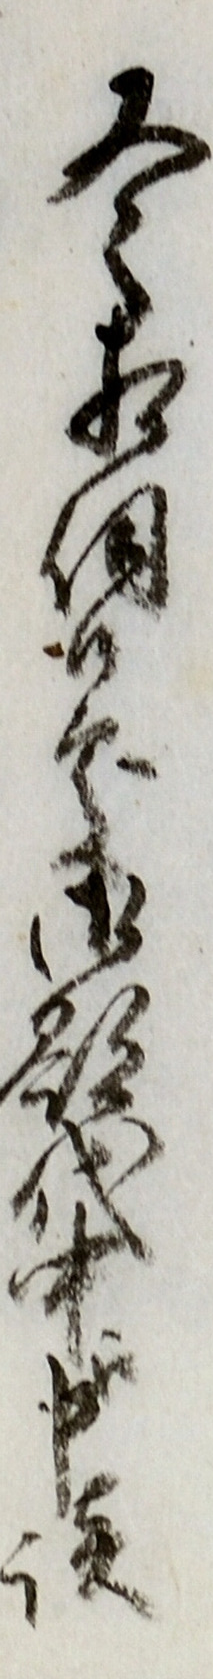又々相伺候処御郡代中え申談
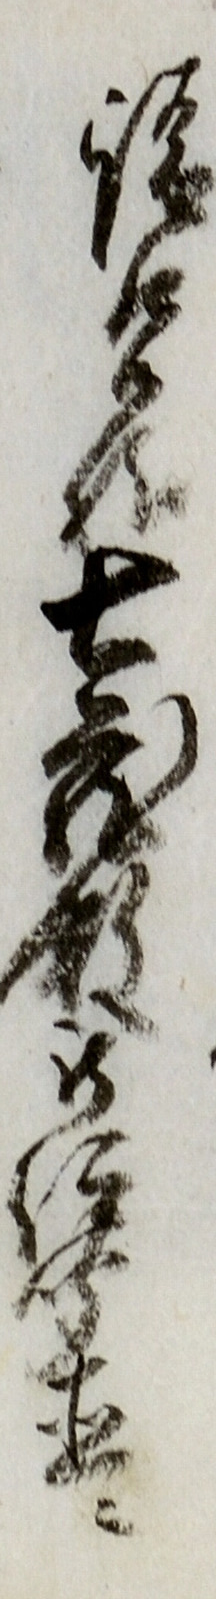清右衛門様七蔵殿被仰聞直に
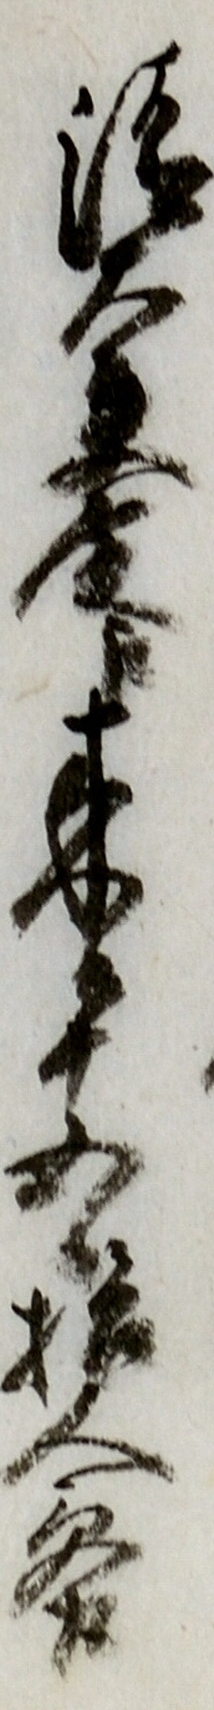清大夫殿え来候十五日拾人受取
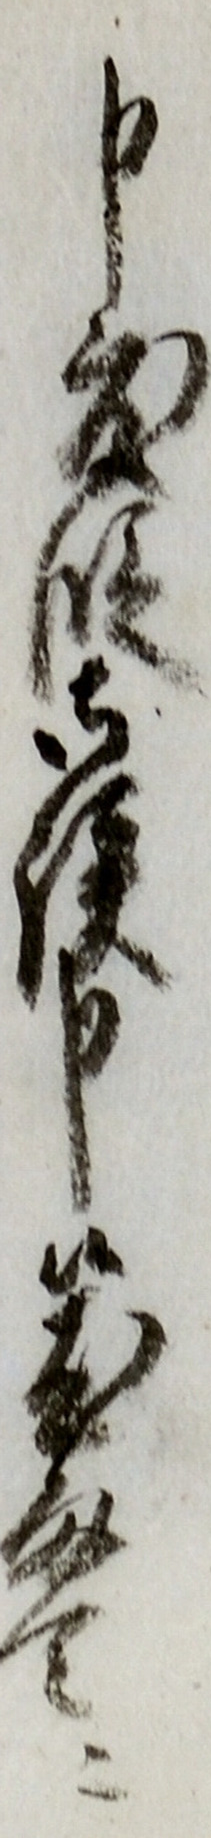申度段御談申候尤雨天に
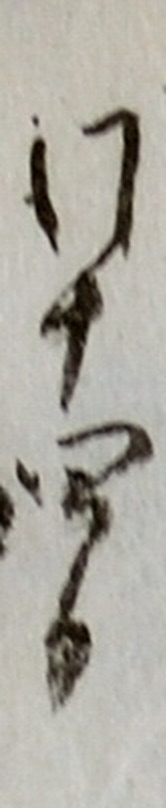同十一日
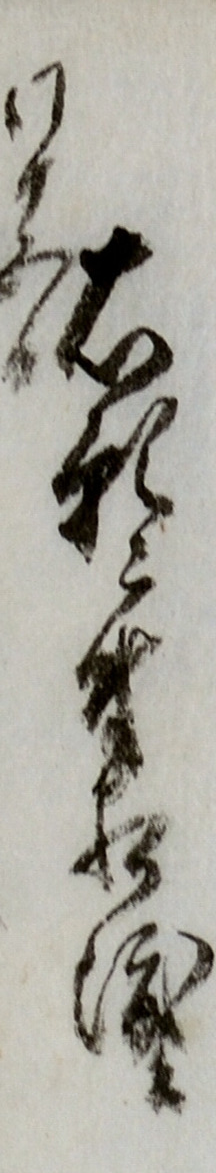右願に付相渡候
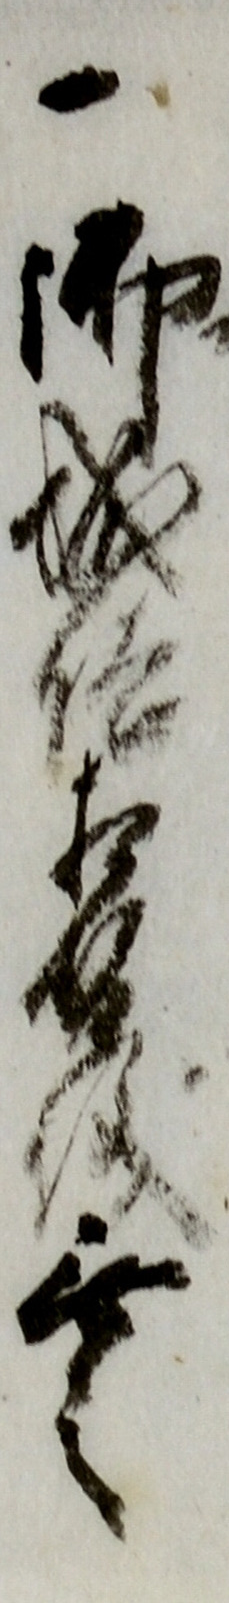一御城詰相替儀無之
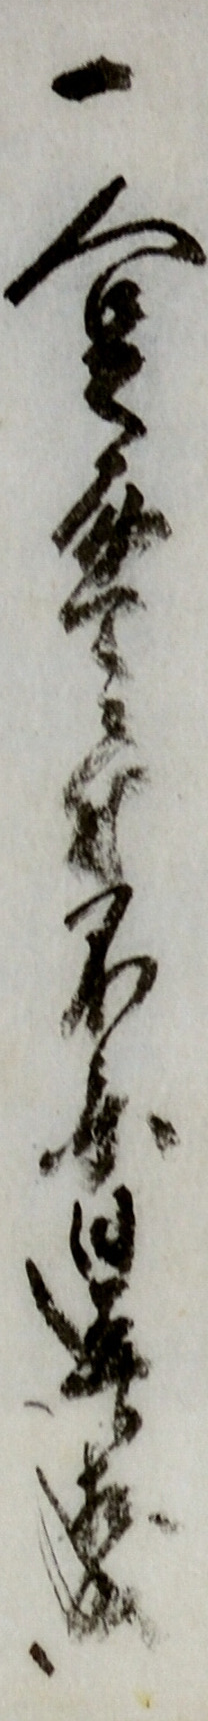一人足雨天に付不参日送り相成候
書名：諸事御用留帳
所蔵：伊那市立高遠町図書館・合同会社AMANE
